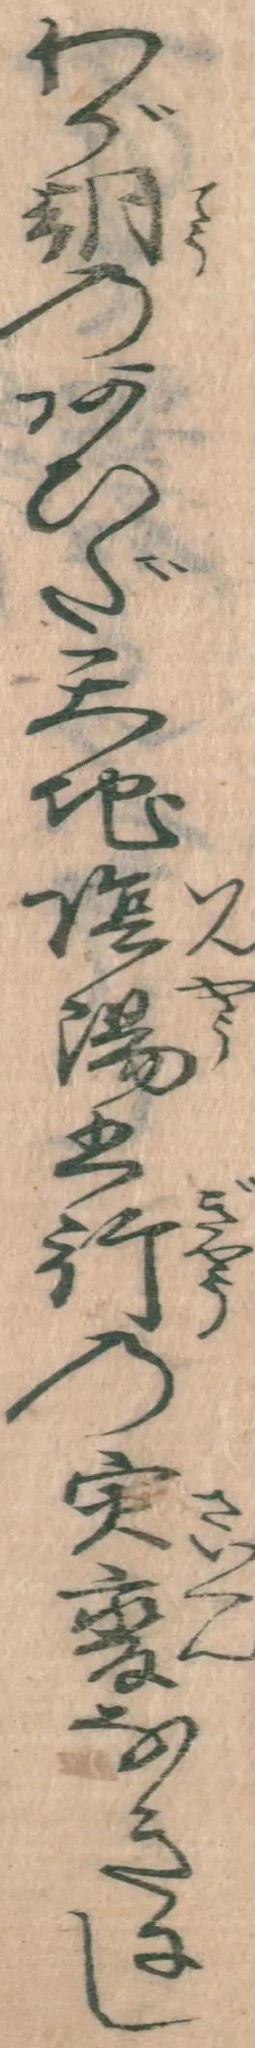わが朝のあひだ天地陰陽五行の灾変なきにし
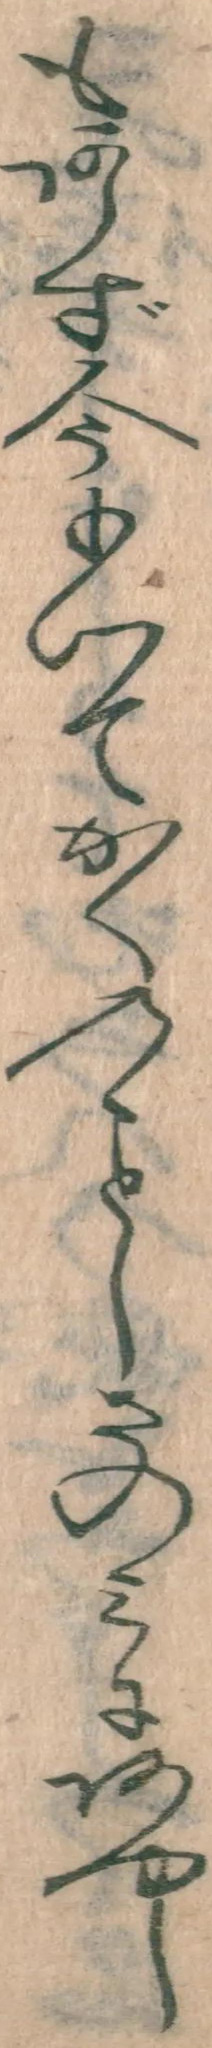もあらず今もいてかくのことしさのみにあやし
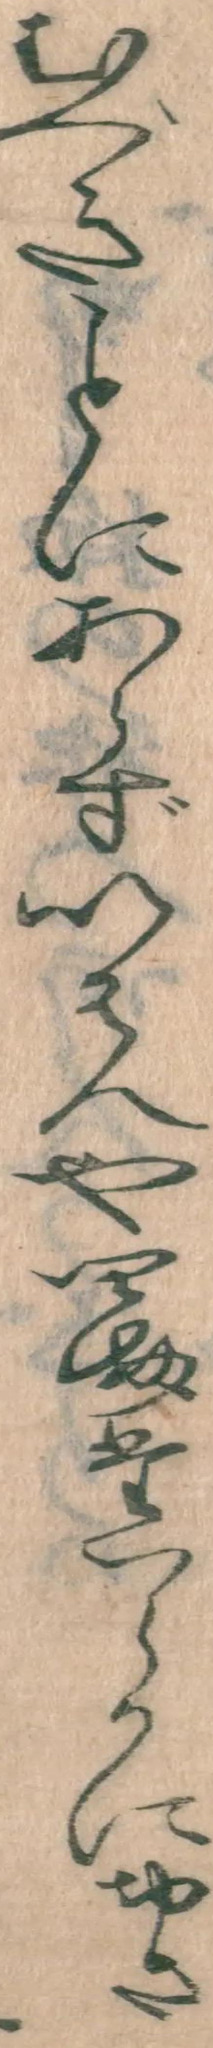むへきことにあらずいはんや四海たいらかにおさ
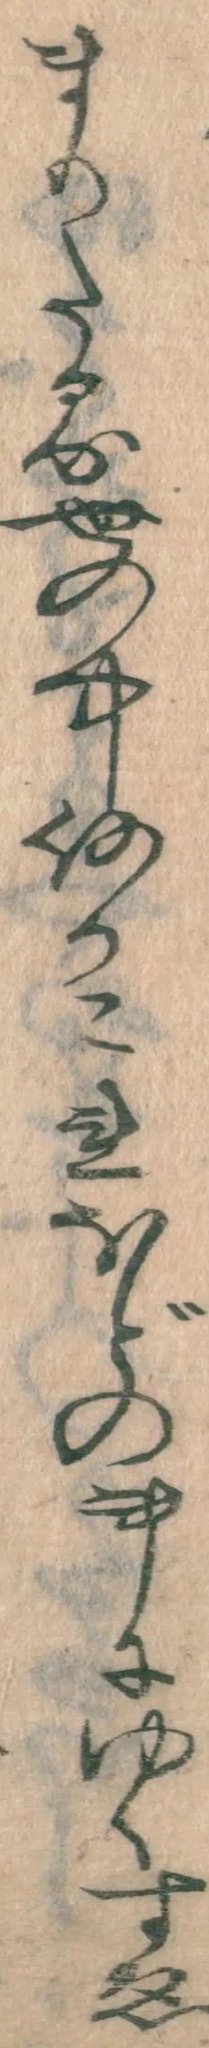まりたる世の中何かこれほどの事にゆくすゑ
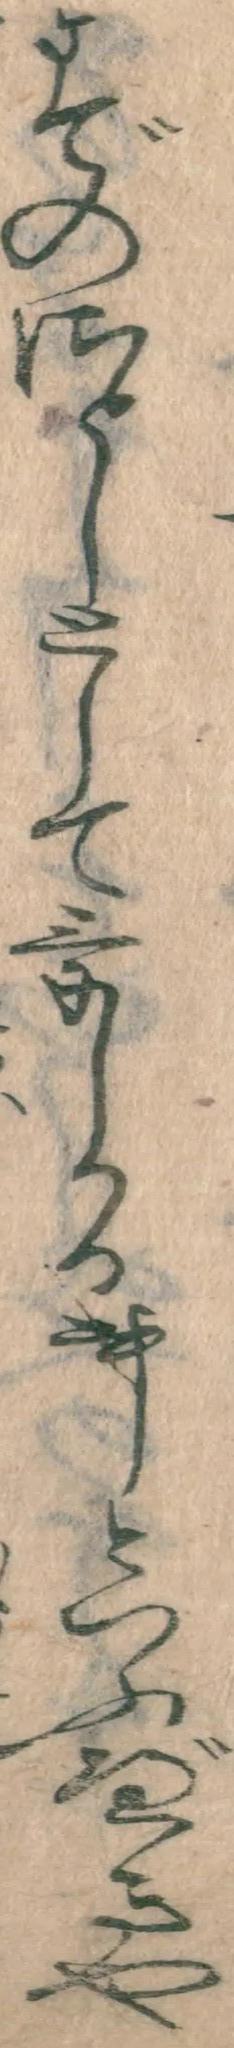までのさとしとしてけしかる事といふべきや
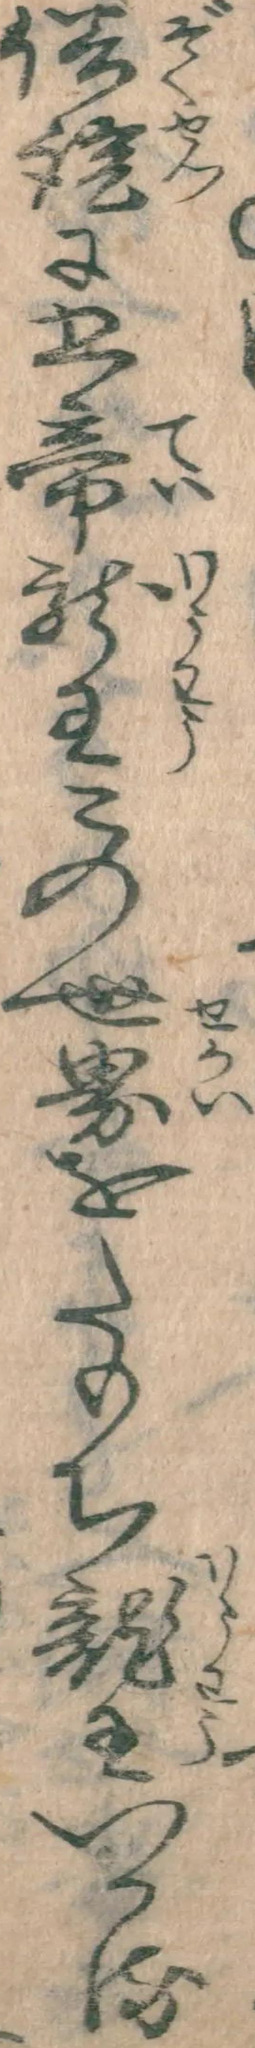俗説に五帝龍王この世界をたもち龍王いかる
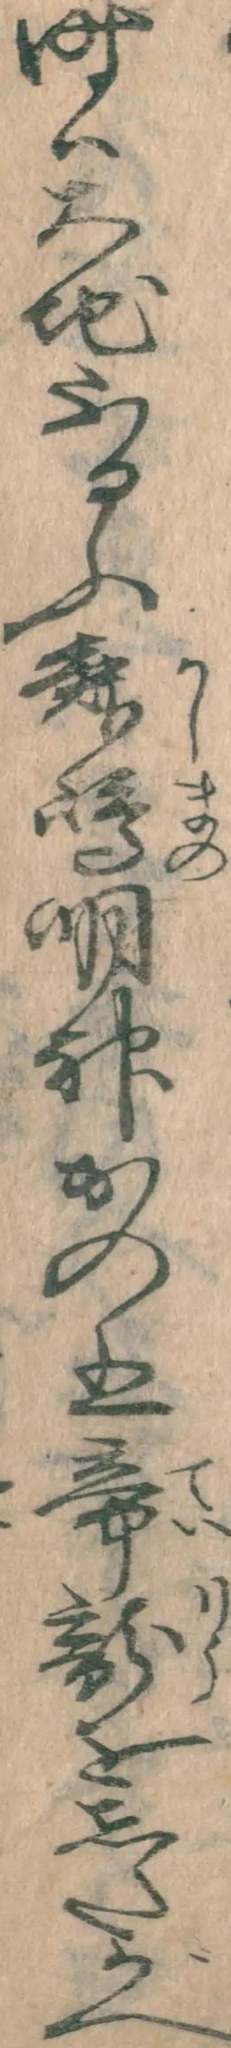時は大地ふるふ鹿島明神かの五帝龍をしたがへ

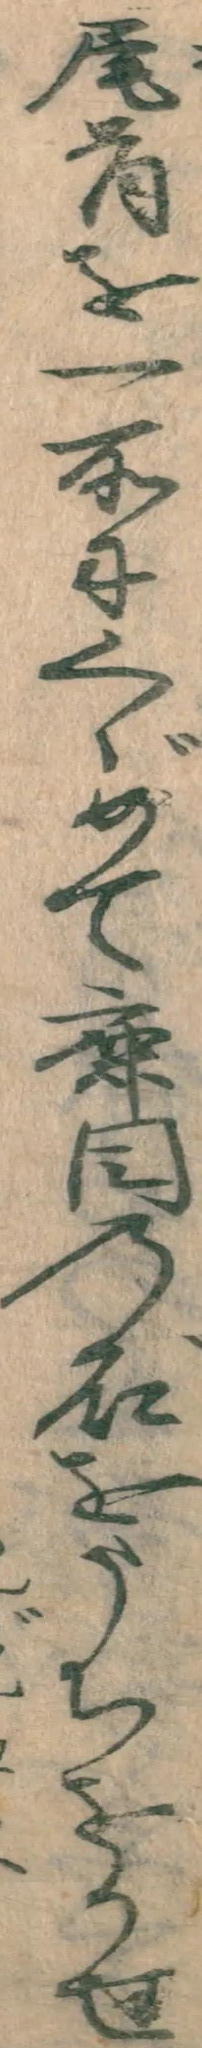尾首を一所にくゞめて鹿目の石をうちをかせ
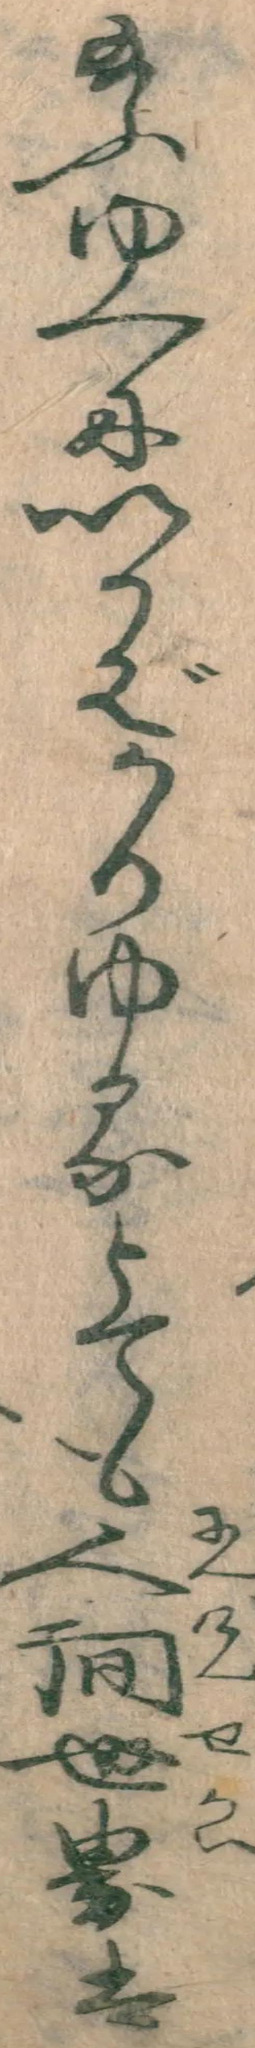給ふゆへにいかばかりゆるとても人間世界は
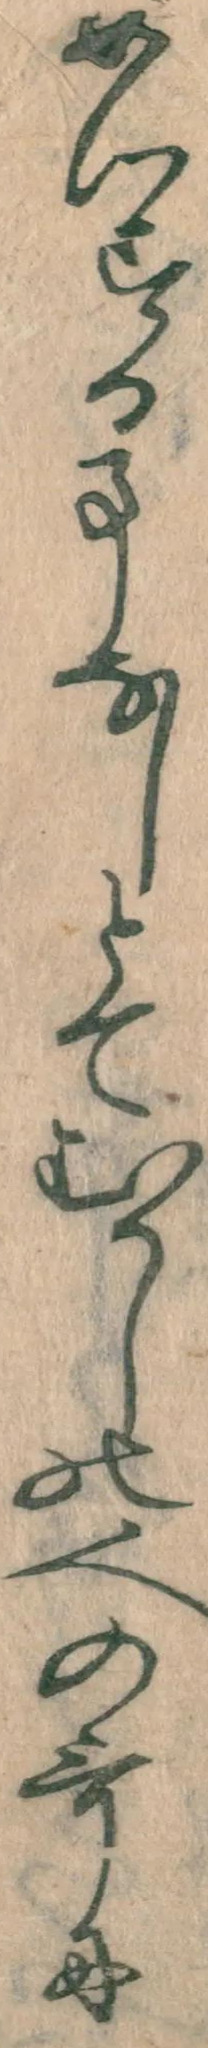めつする事なしとてむかしの人の哥に
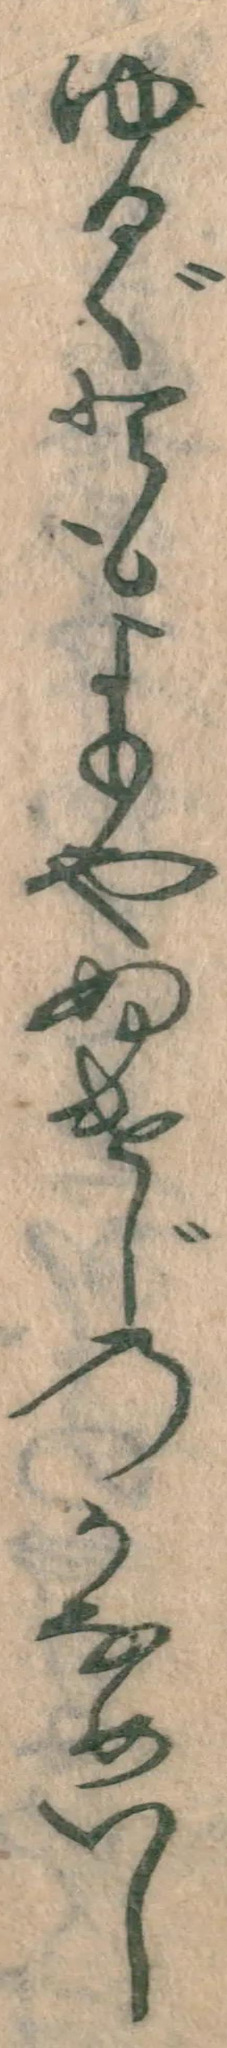ゆるぐともよもやぬけじのかなめいし
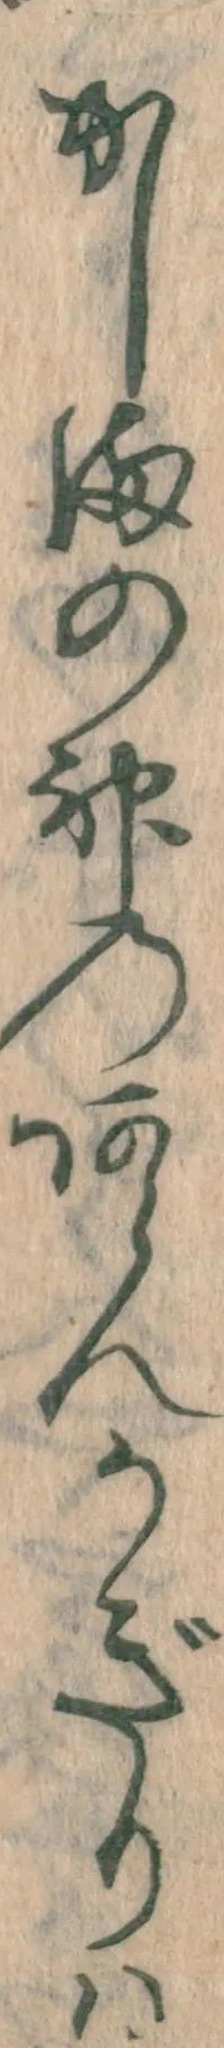かしまの神のあらんかぎりは
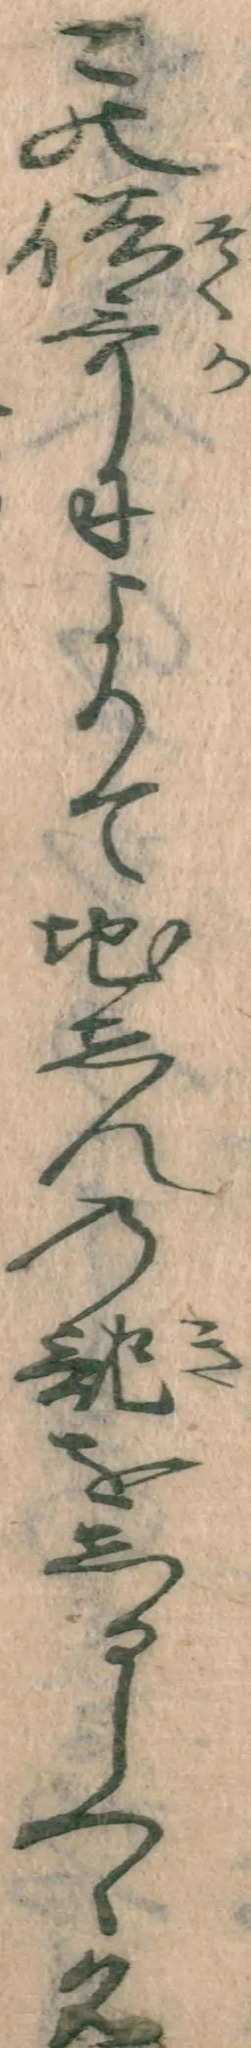この俗哥によりて地しんの記をしるしつゝ名
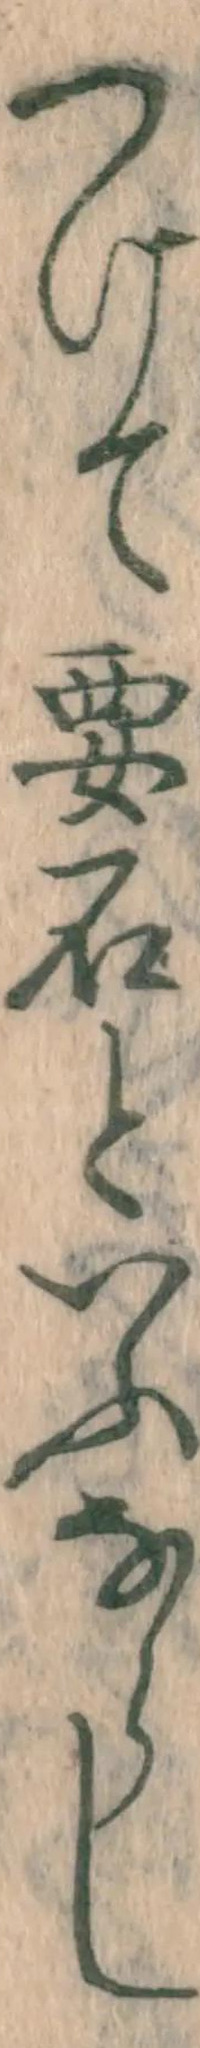づけて要石といふならし
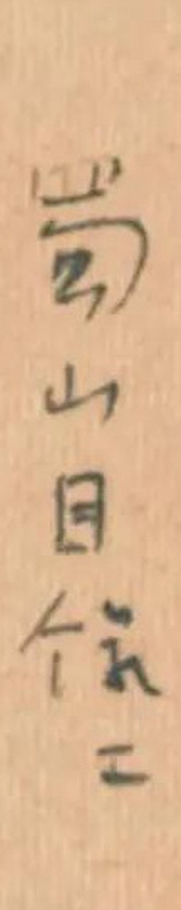蜀山目録ニ
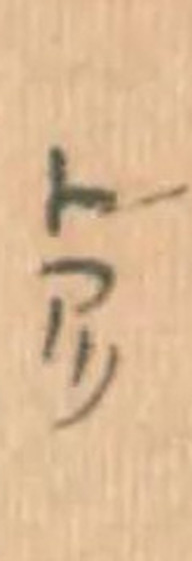トアリ
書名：艱難目異志. 上,下
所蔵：国立国会図書館 National Diet Library, JAPAN
